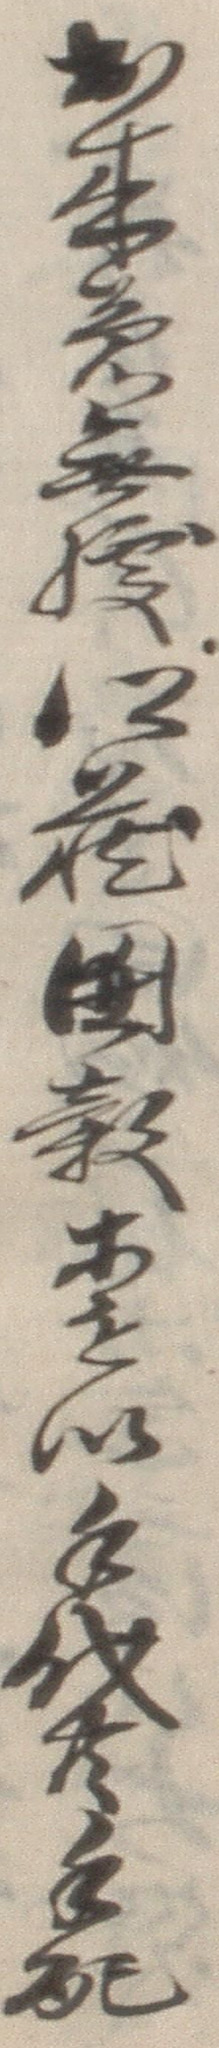出来兼無拠郷倉囲穀等を以手代共手配
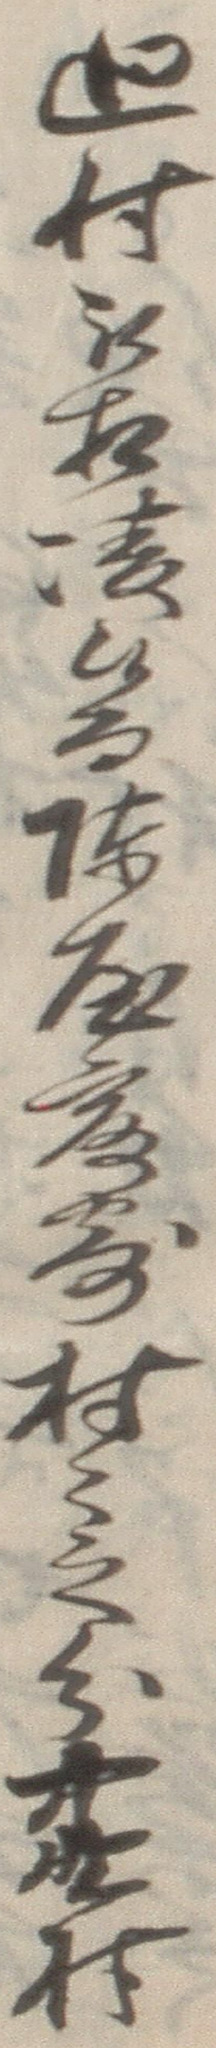廻村被相凌候而陣屋最寄村々之分中野村
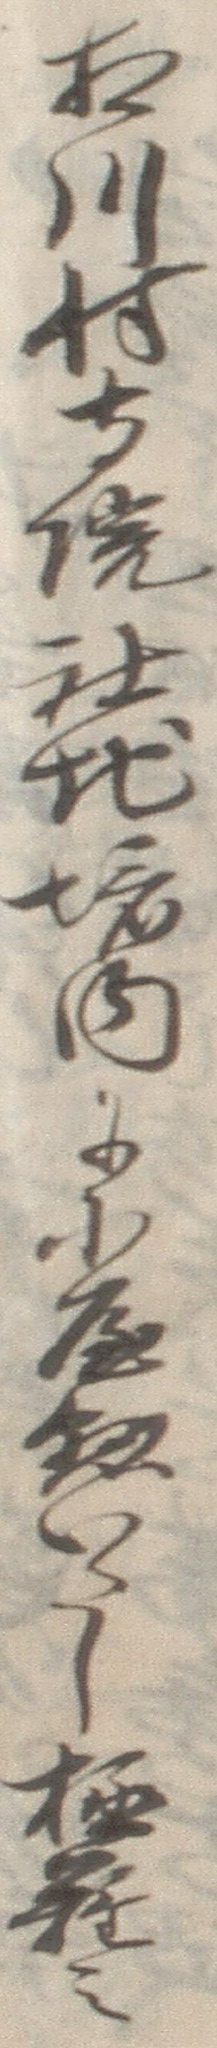松川村寺院社地境内に小屋懸いたし極難之
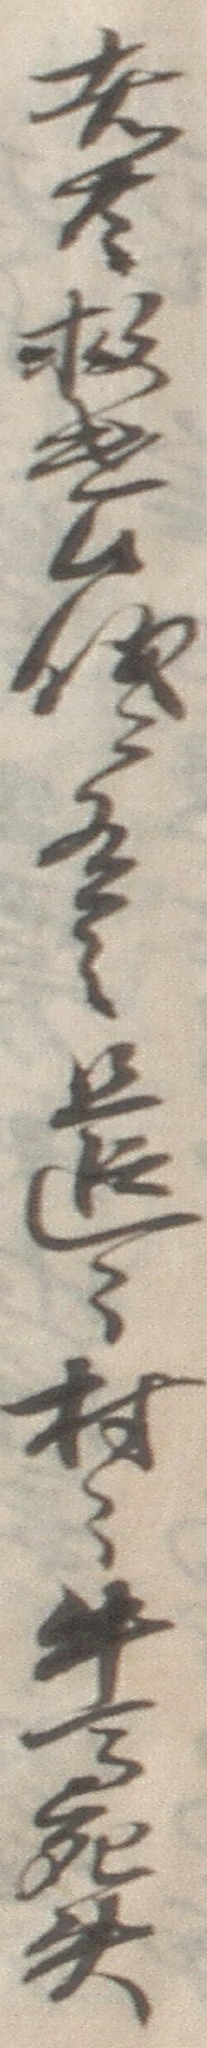者共救遣候儀二有之且追々村々牛馬死失
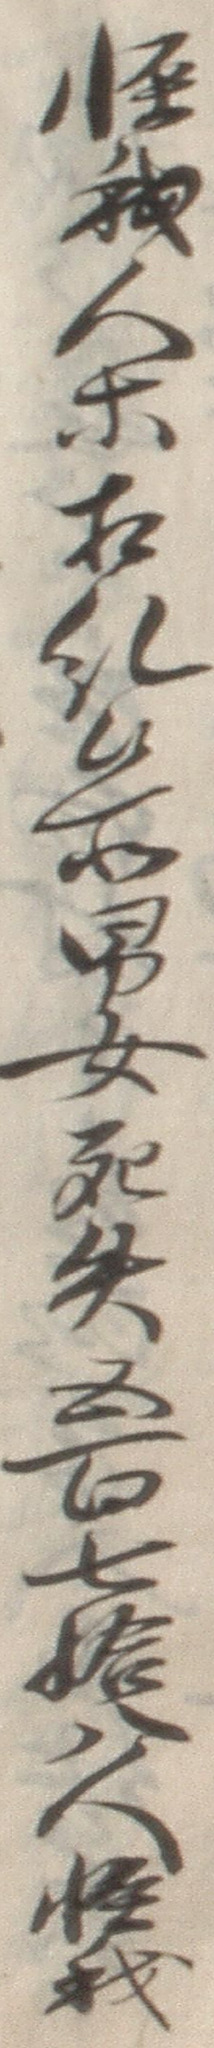怪我人等相糺候所男女死失五百七拾八人怪我
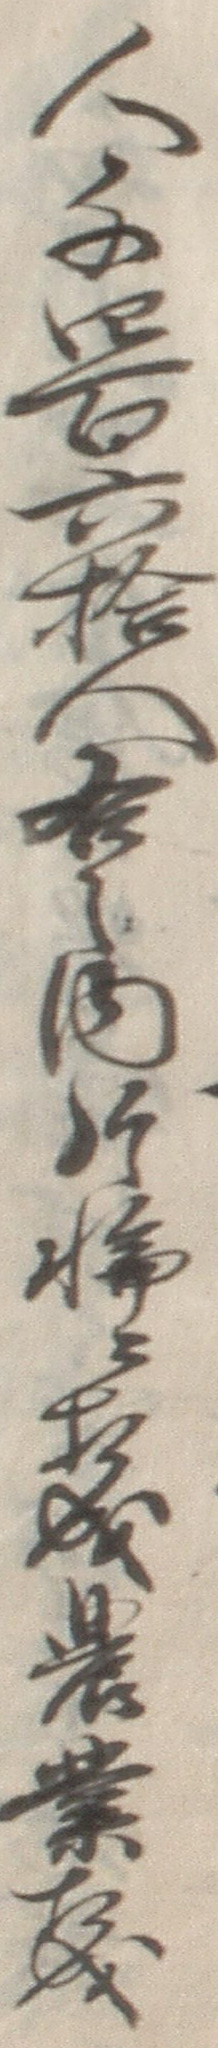人千四百六拾人右之内片輪二相成且農業相成
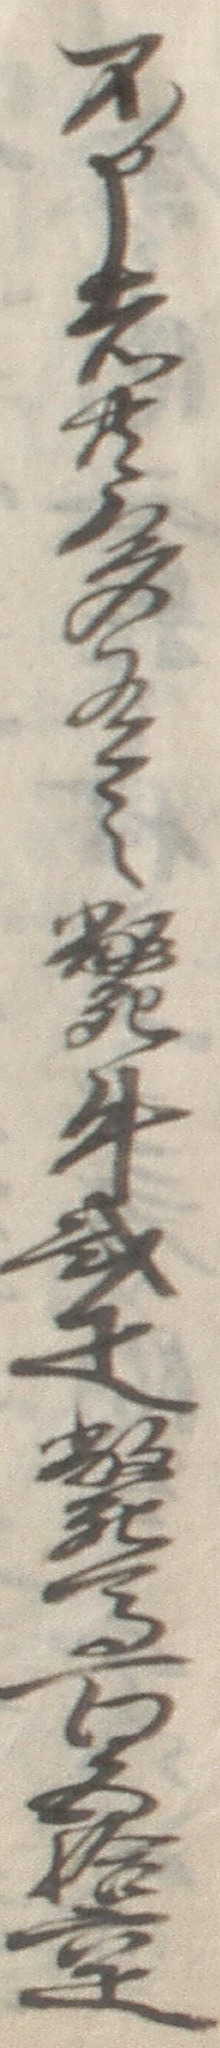不申者共多有之斃牛弐疋斃馬百五拾六疋
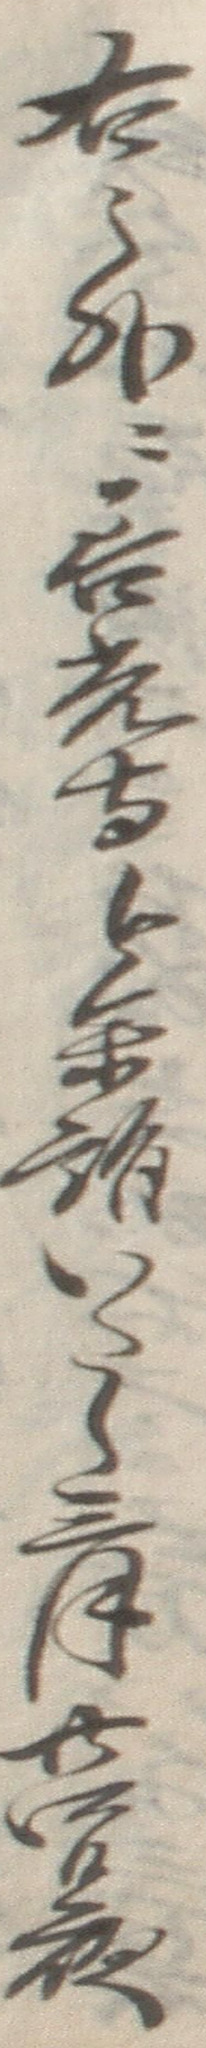右之外二善光寺江参詣いたし三月廿四日夜
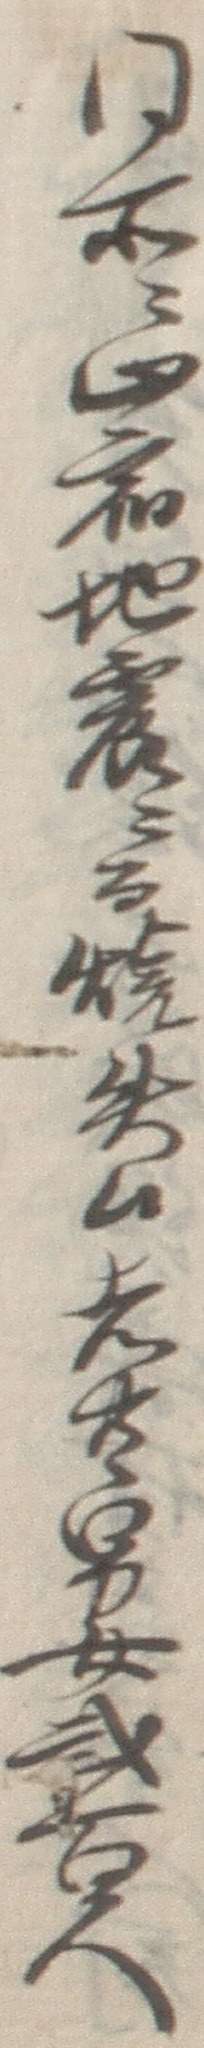同所二止宿地震二而焼失候者共男女弐百人

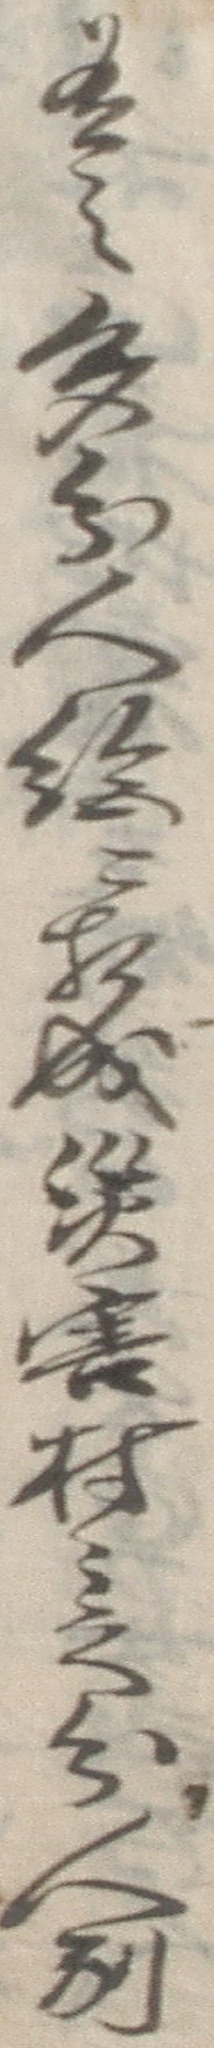有之多分人絶二相成災害村々之分人別
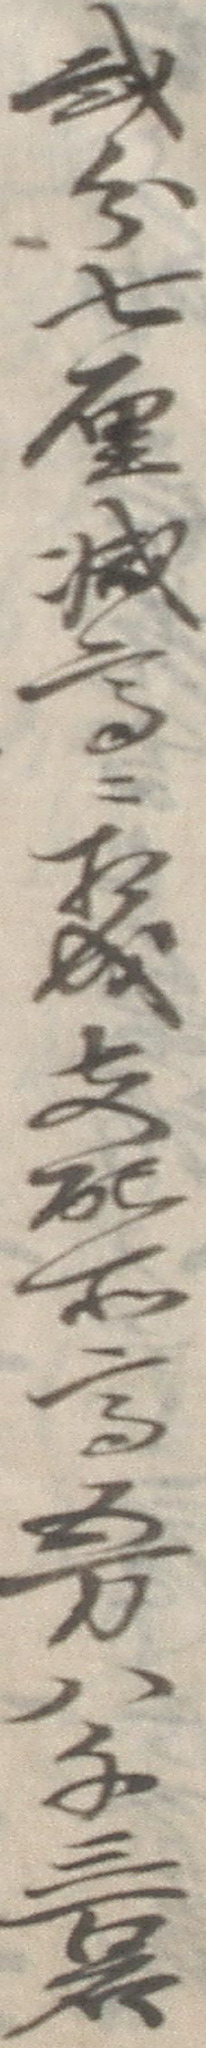弐分七厘減高二相成支配所高五万八千三百石
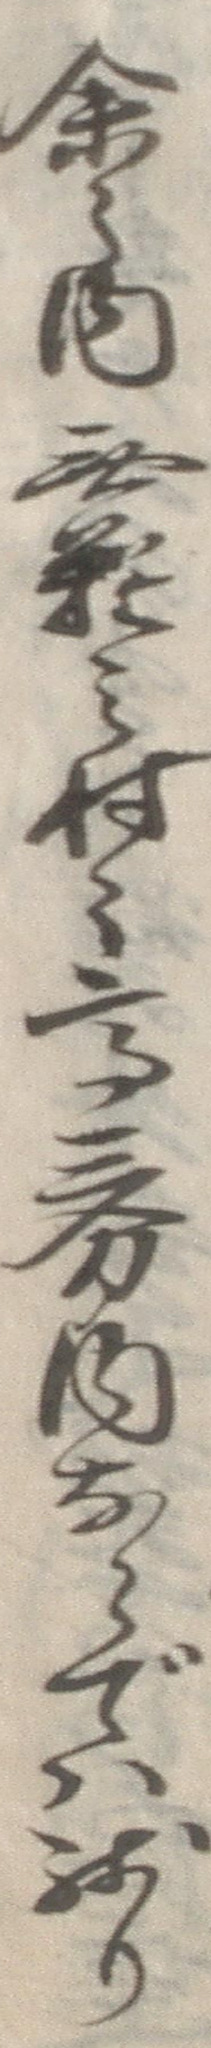余之内無数之村々高三分内ならでハ残
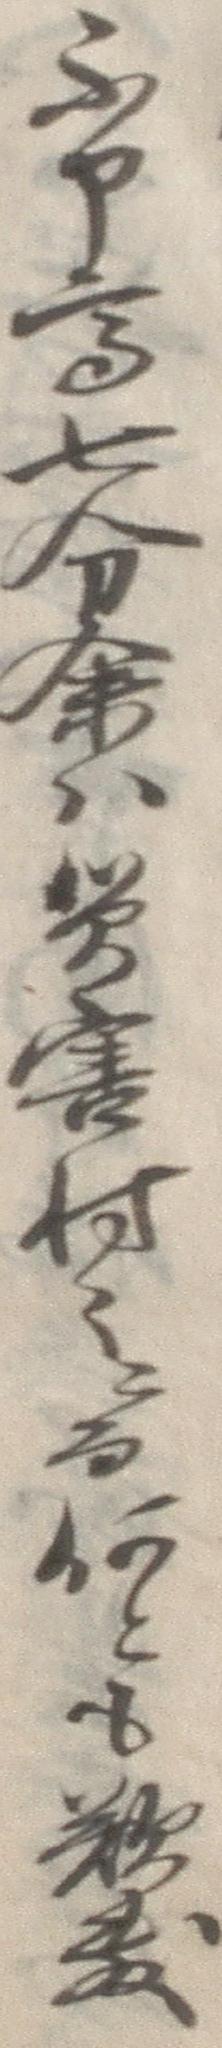不申高七歩分余ハ災害村々二而何とも嘆敷
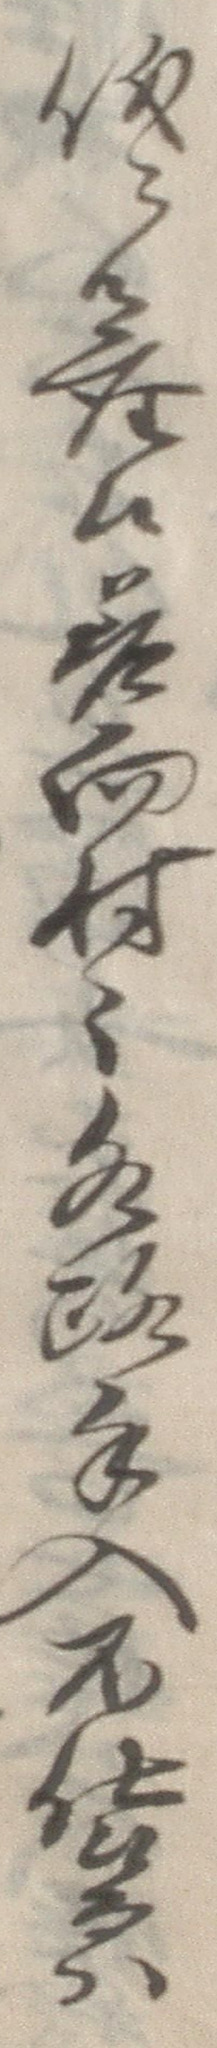儀二御座候差向村々水路手入不仕候而ハ
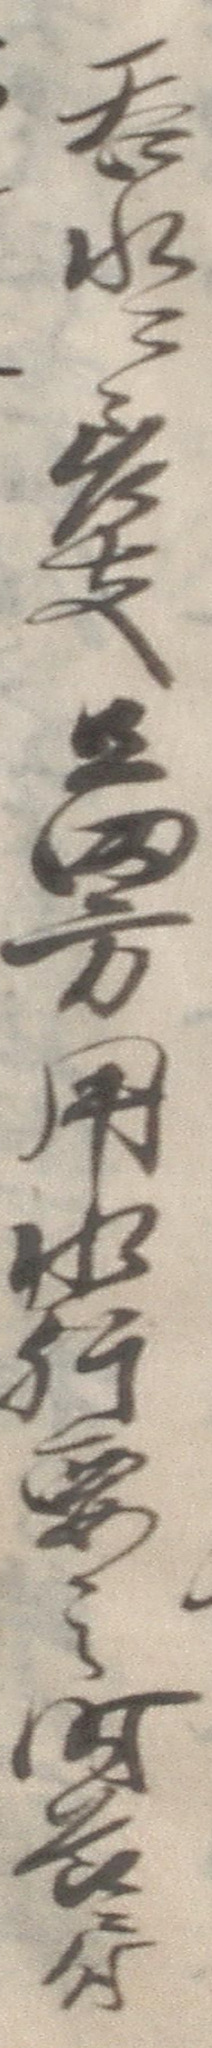呑水二差支且田方用水肝要之時節二付
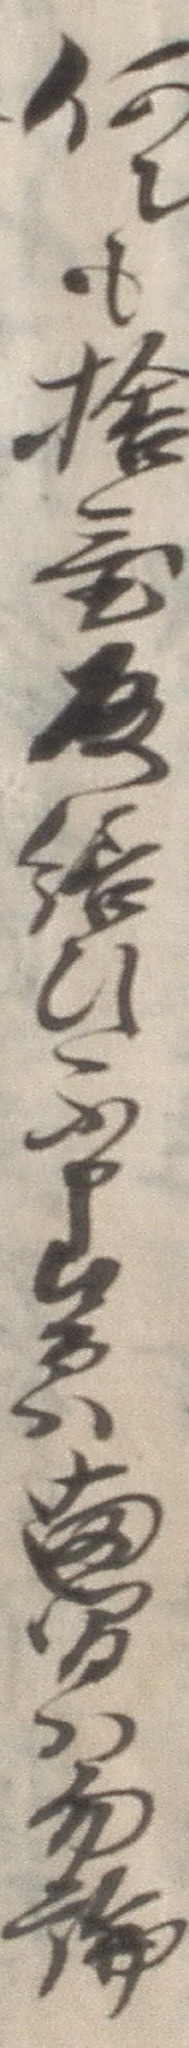何ㇾも捨置取繕ひ不申候而ハ苗間ハ勿論
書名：信州地震一件
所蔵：東京大学地震研究所図書室 Earthquake Research Institute Library, The University of Tokyo, JAPAN
